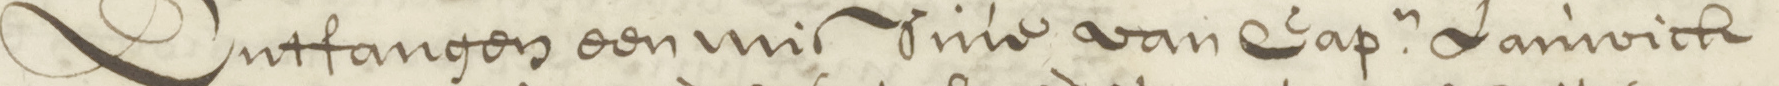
Ontfangen een missiue van Capn. Lauwick
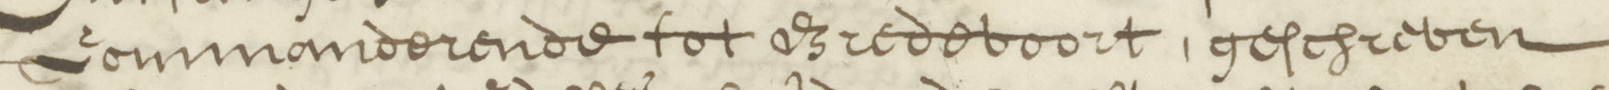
commanderende tot Bredevoort, geschreven
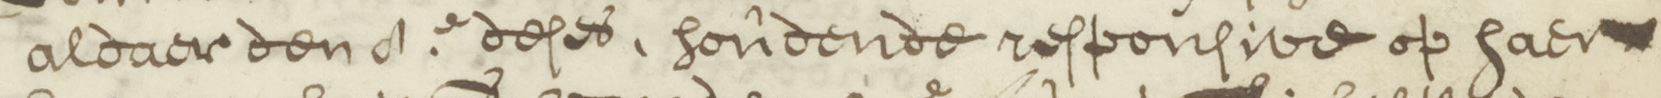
aldaer den 8e. deses, houdende responsive op haer
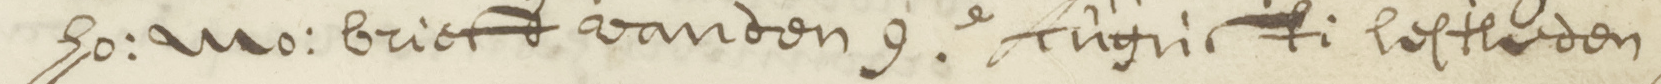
ho:Mo: brieff van den 9e. Augusti lestleden
